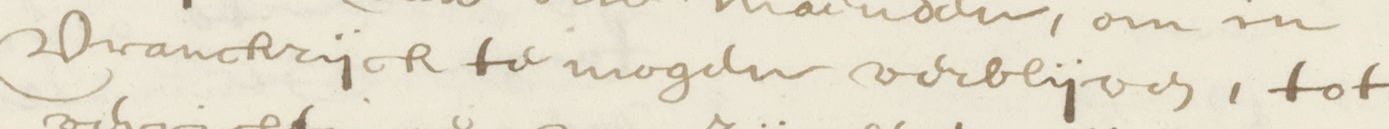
Vranckrijck te mogen verblijven, tot
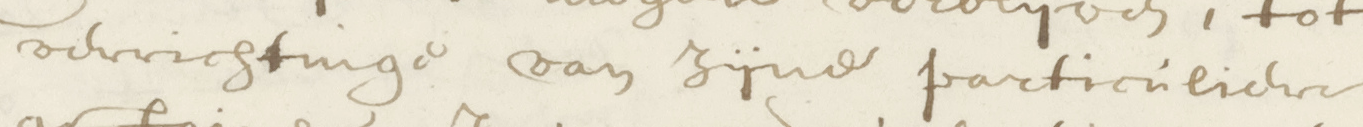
verrichtinge van zijne particuliere
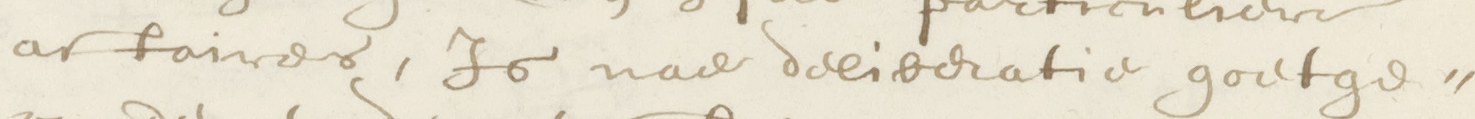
affaires. Is nae deliberatie goetge„
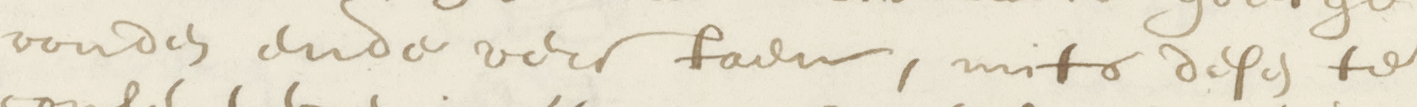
vonden ende verstaen, mits desen te
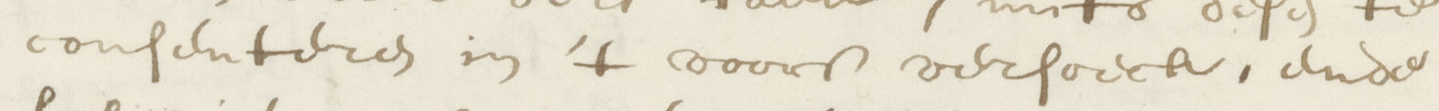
consenteren in 't voors versoeck, ende
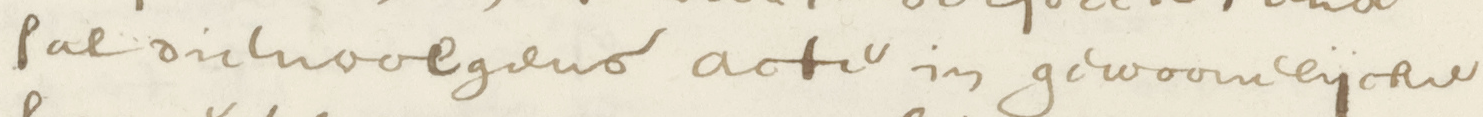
sal dienvolgens acte in gewoonelijcke
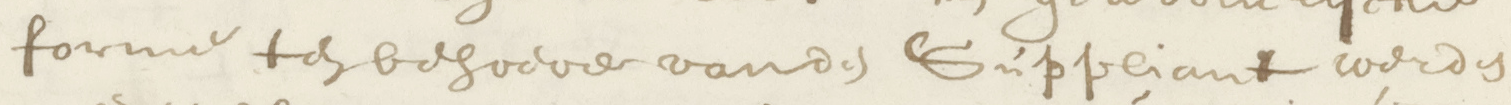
forme ten behoeve vanden Suppliant werden
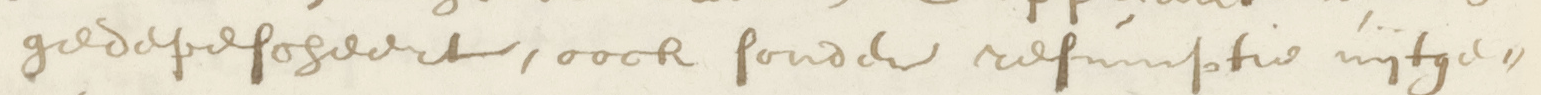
gedepescheert, oock sonder resumptie uijtge„
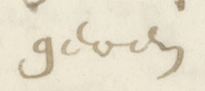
geven
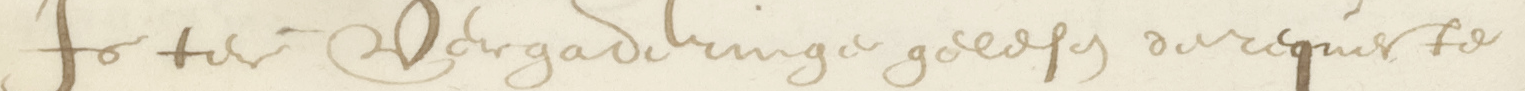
Is ter Vergaderinge gelesen de requeste
